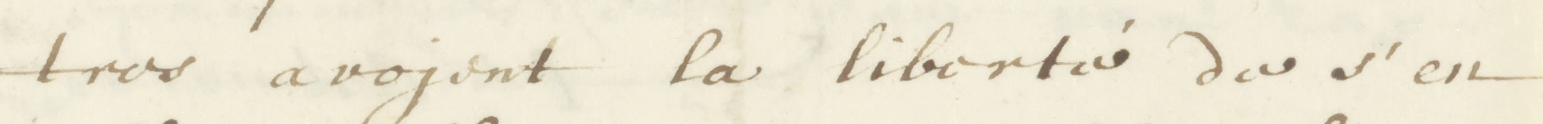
tres avojent la liberté de s‛en
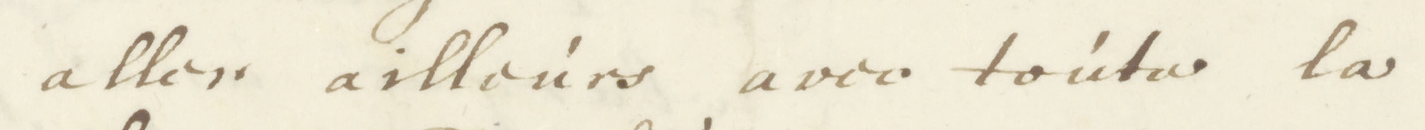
aller ailleurs avec toute la
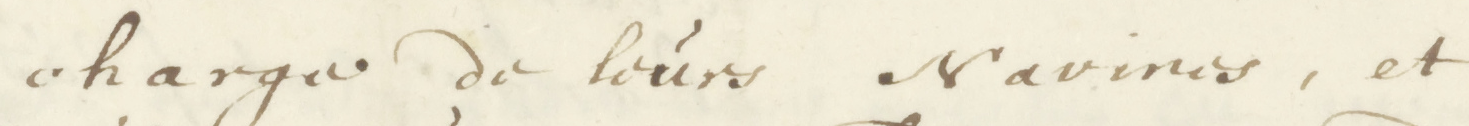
charge de leurs Navines, et
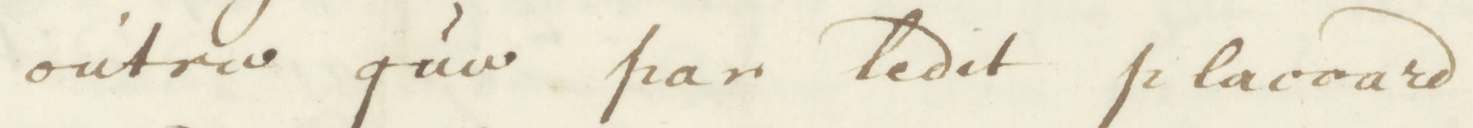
outre que par ledit placcard
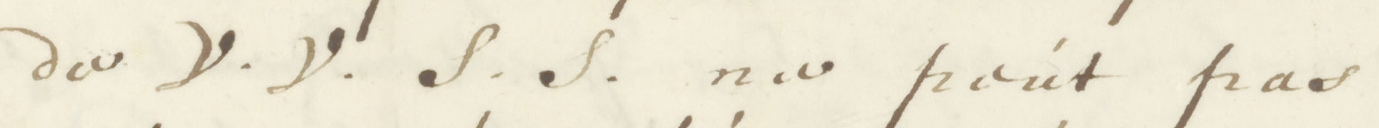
de V.V. S. S. ne peut pas
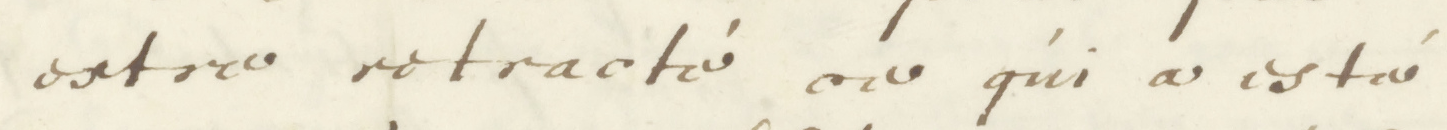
estre retracté ce qui a esté
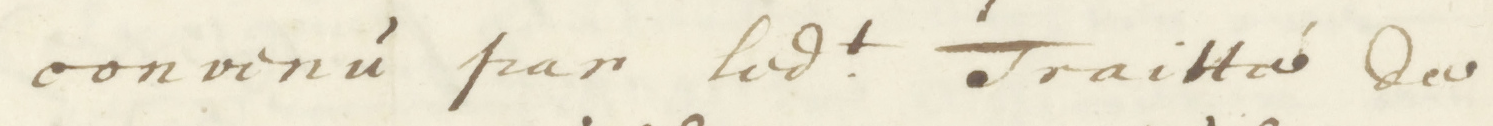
convenu par ledt. Traitté de
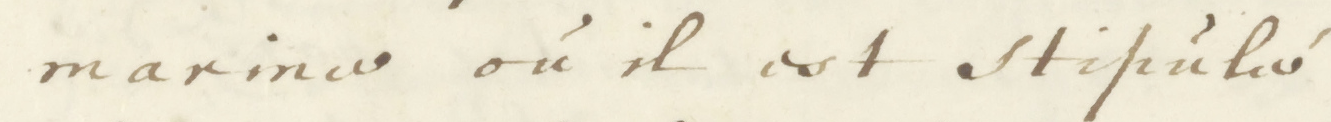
marine ou il est stipulé
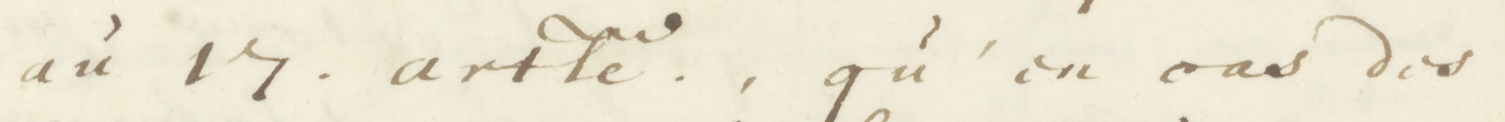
au 17. artle., qu'en cas des
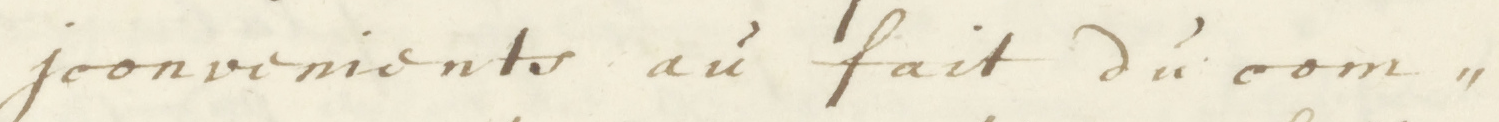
iconvenients au fait du com„
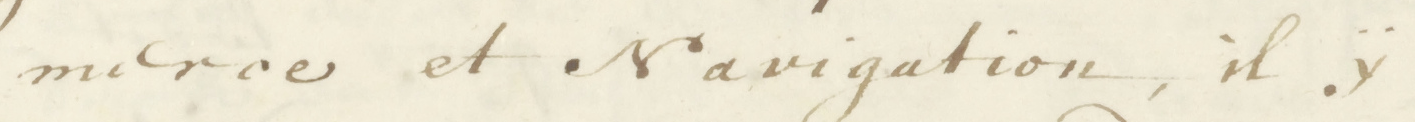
merce et Navigation, il ij
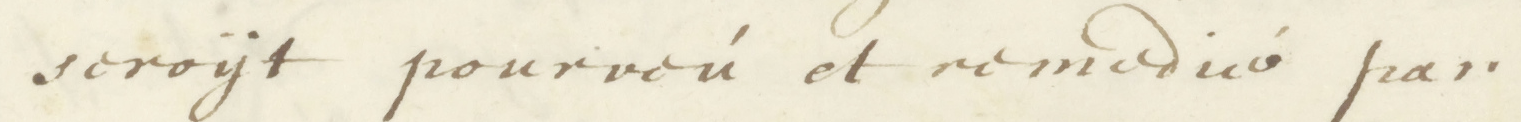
seroijt pourveu et remedié par
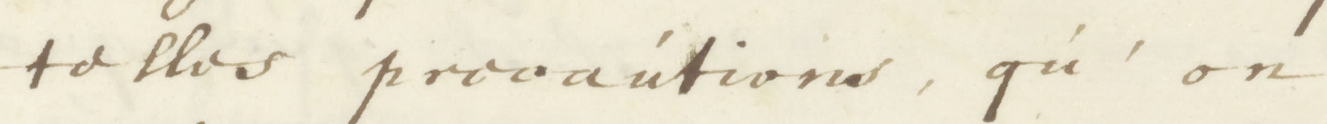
telles precautions, qu‛ on
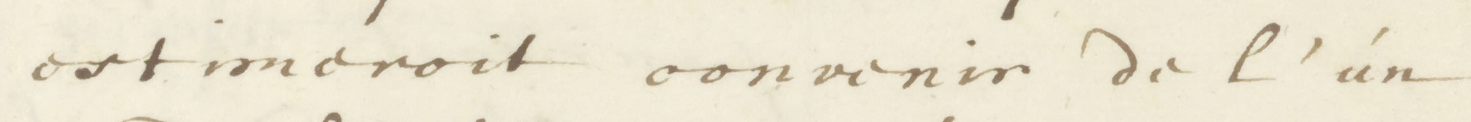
estimeroit convenir de l‛un
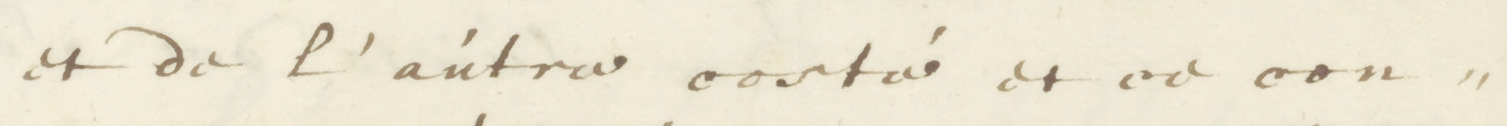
et de l‛autre costé et ce con„
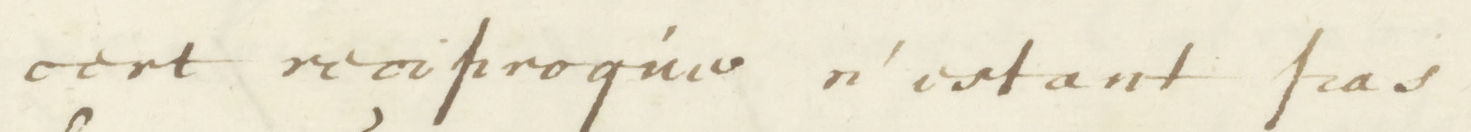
cert reciproque n'estant pas
